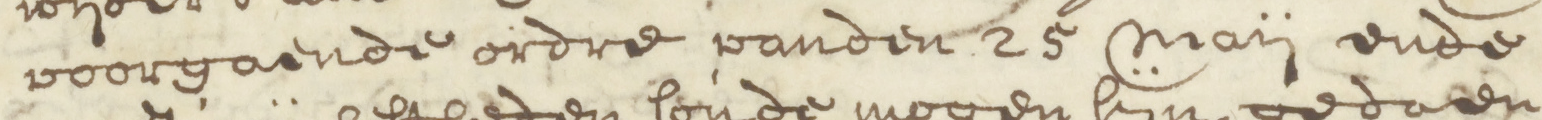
voorgaende ordre vanden 25 Maij ende
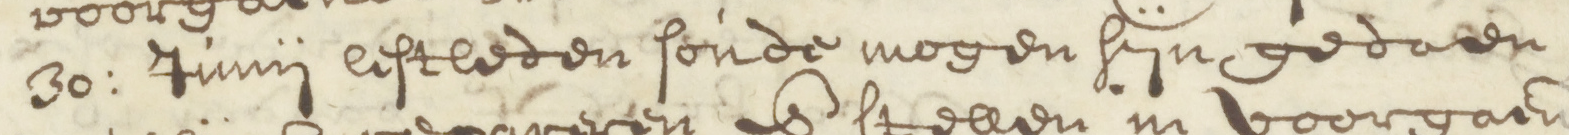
30: Junij lestleden soude mogen sijn gedaen,
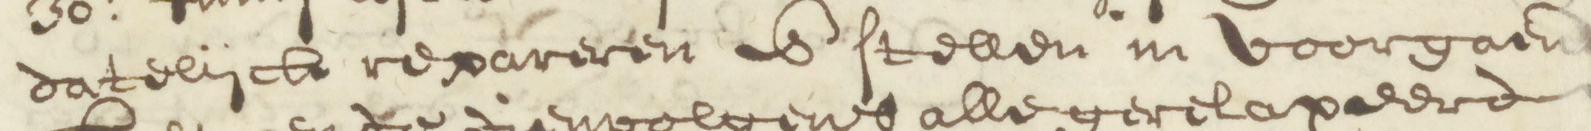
datelijck repareren en stellen in voorgaende
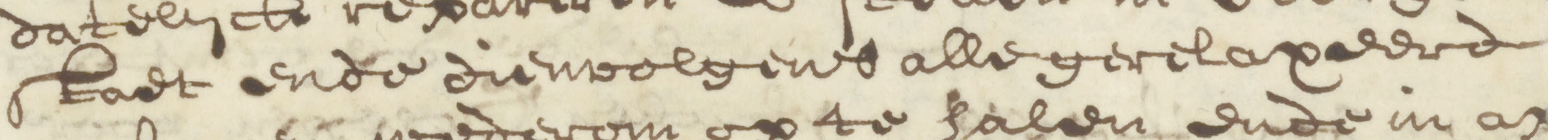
staet ende dienvolgens alle gerelaxeerde
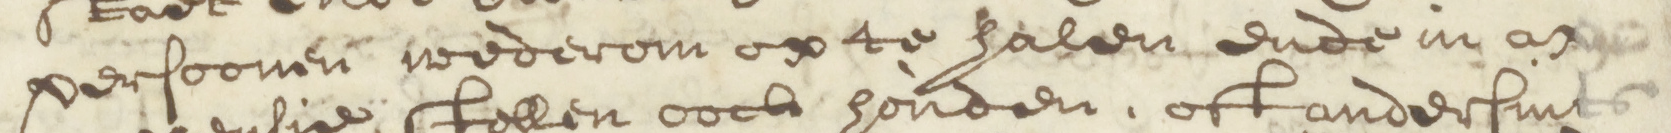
persoonen wederom op te halen ende in ap„
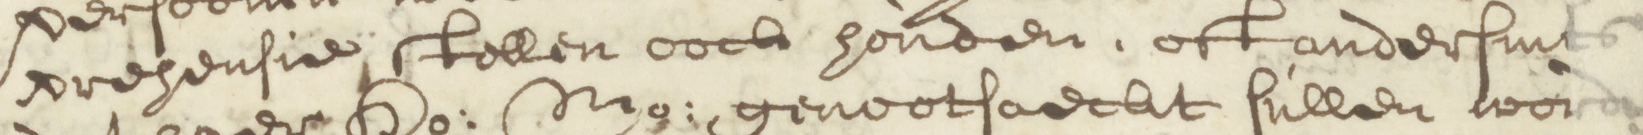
prehensie stellen oock houden, off andersints
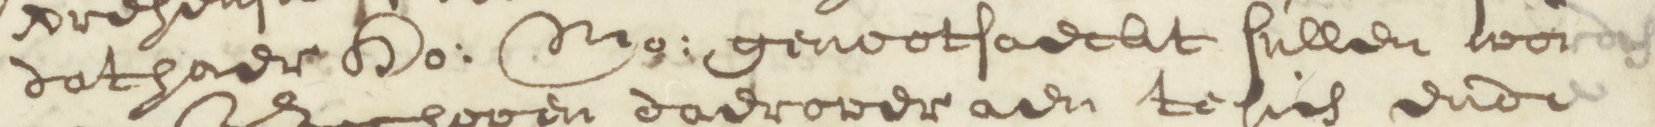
dat haer Ho:Mo: genootsaeckt sullen worden
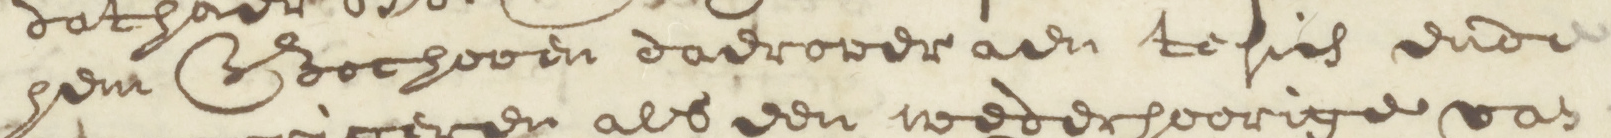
hem Bochoven daerover aen te sien ende
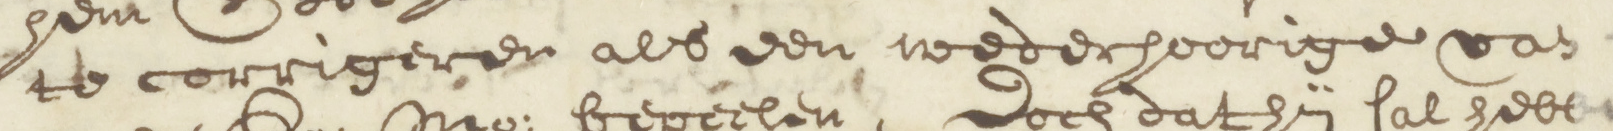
te corrigeren als een wederhoorige van
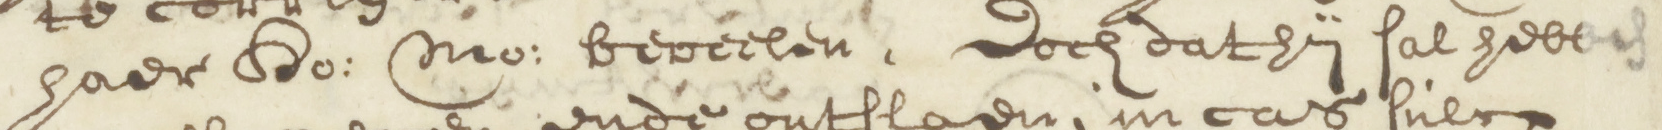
haer Ho:Mo: beveelen. Doch dat hij sal hebben
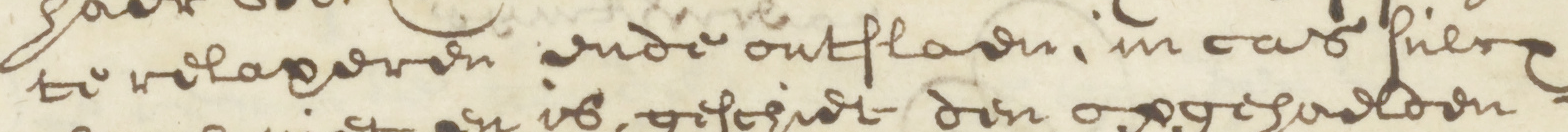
te relaxeren ende ontslaen, in cas sulcx
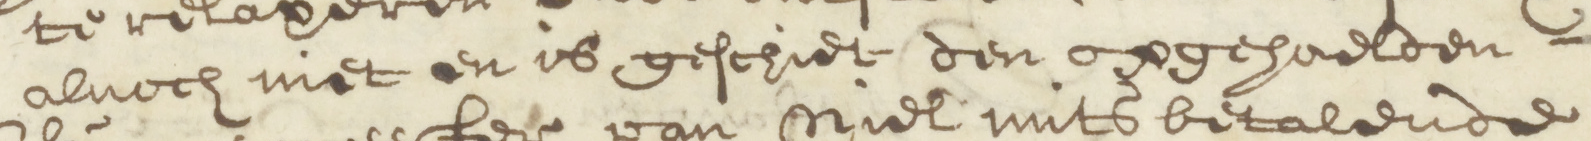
alnoch niet en is geschiet den opgehaelden -
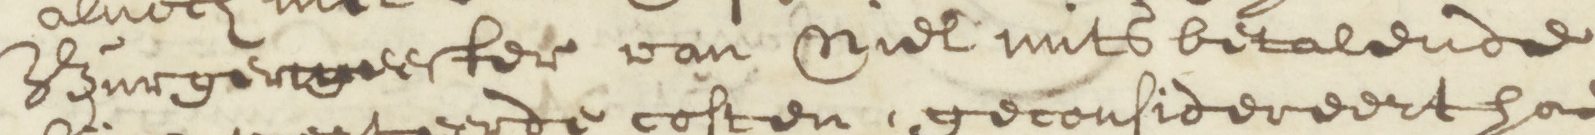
Burgermeester van Niel mits betalende
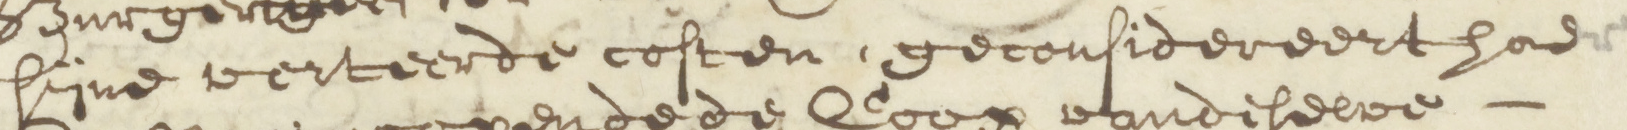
sijne verteerde costen, geconsidereert haer
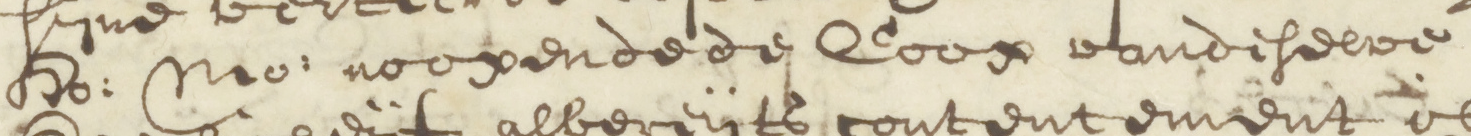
Ho:Mo: noopende de Coop van deselve
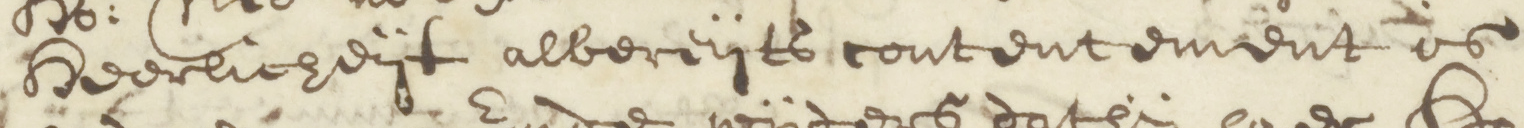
Heerlicheijt albereijts contentement is
